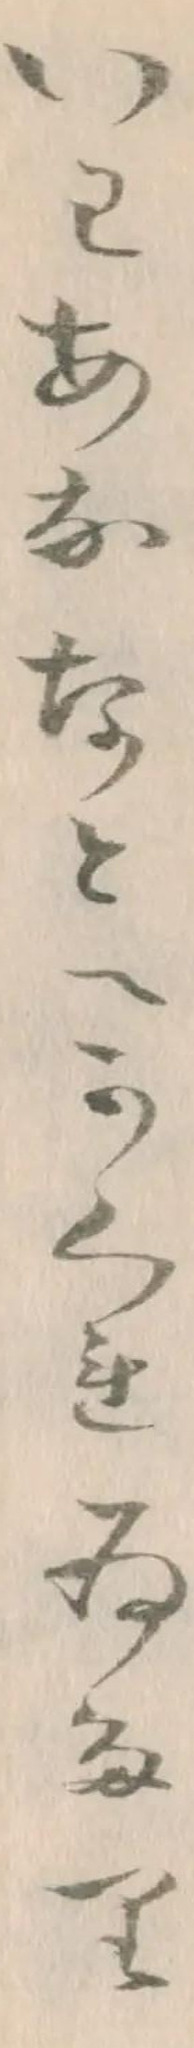いわあななとへかくれゐたり
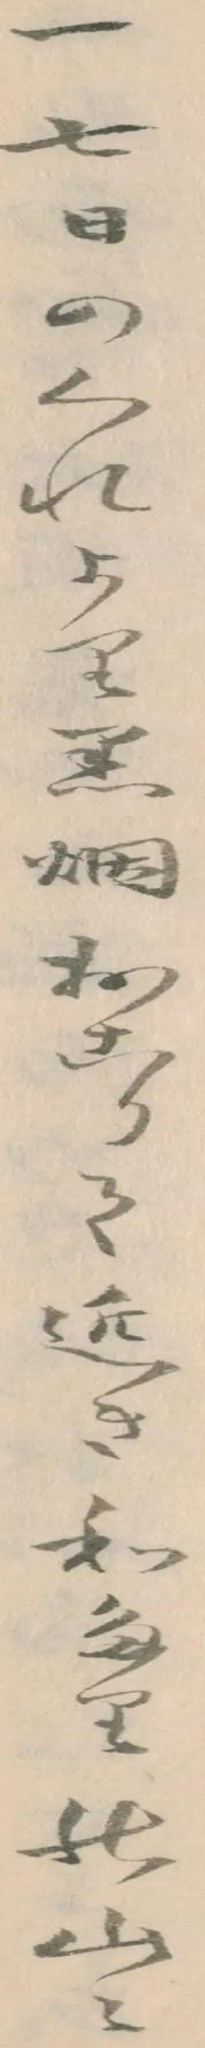一七日のくれより黒烟おこりて近きわたりの山々

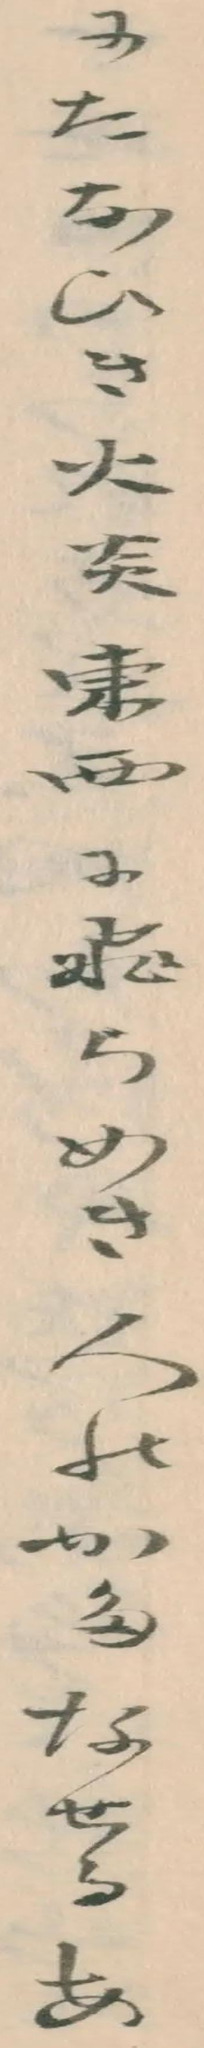にたなひき火炎東西にひらめき人のかたなせるあ
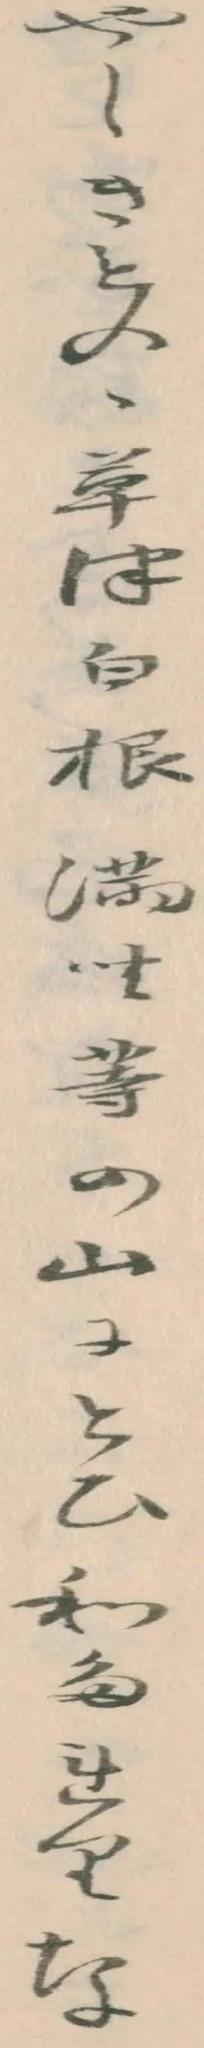やしきものゝ草津白根満坐等の山にとひわたれりな
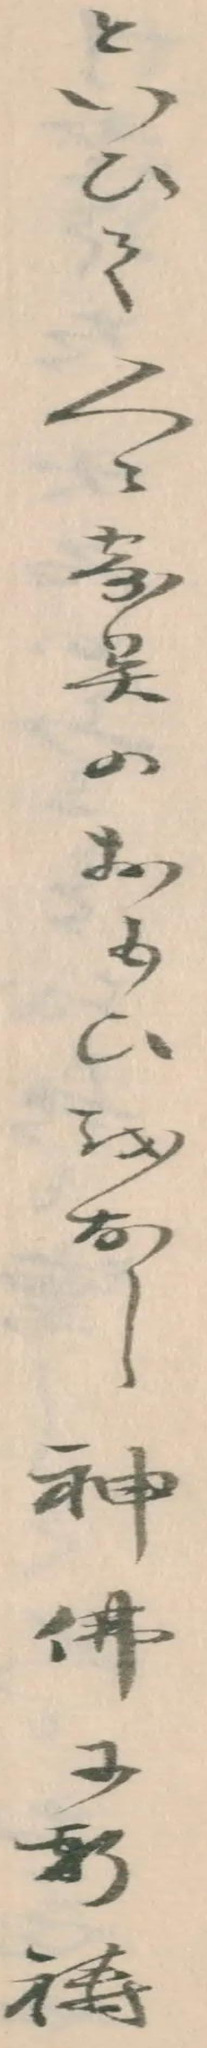といひて人々奇異のおもひをなし神仏に祈祷
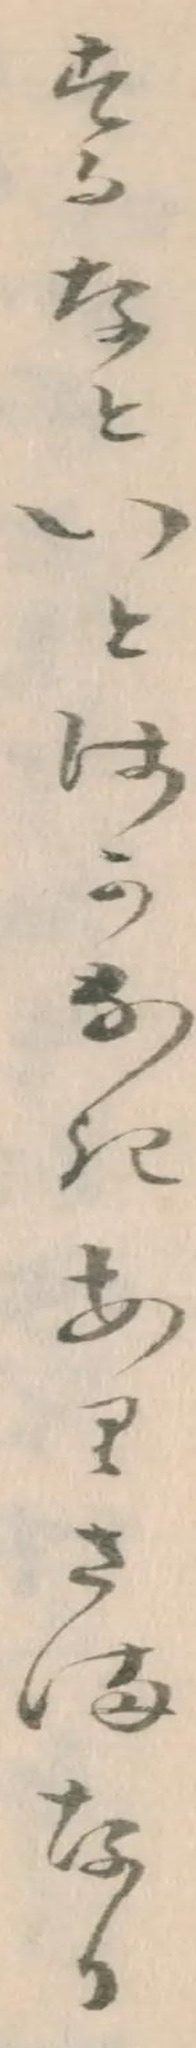するなといとはかなきありさまなり
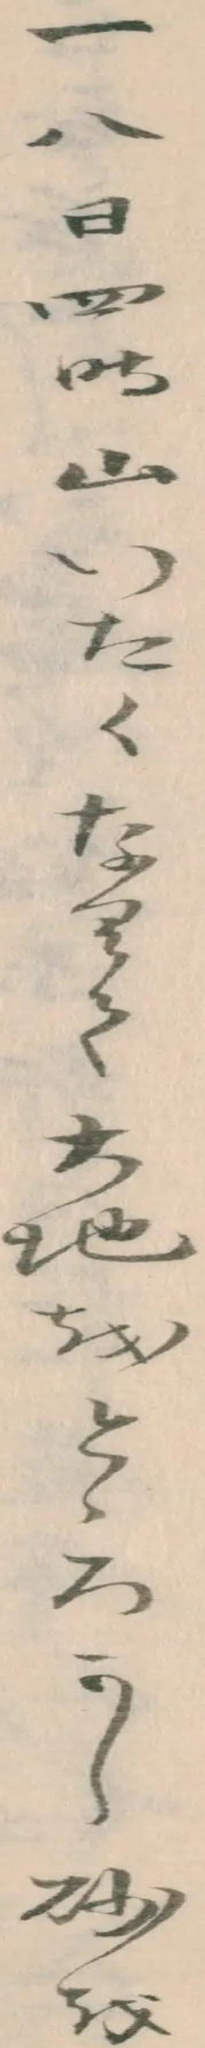一八日四時山いたくなりて大地をとゝろかし砂を
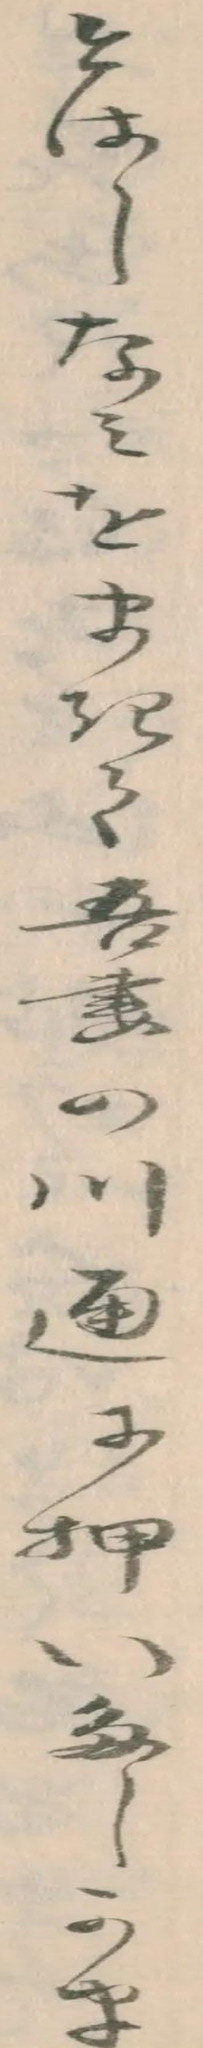とはしなみをまきて吾妻の川通に押いたしかま
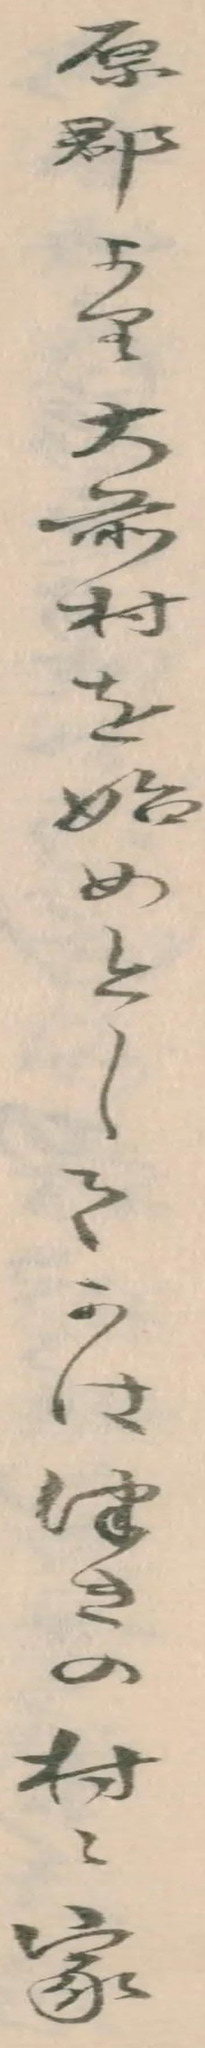原郡より大前村を始めとしてかはつきの村々家
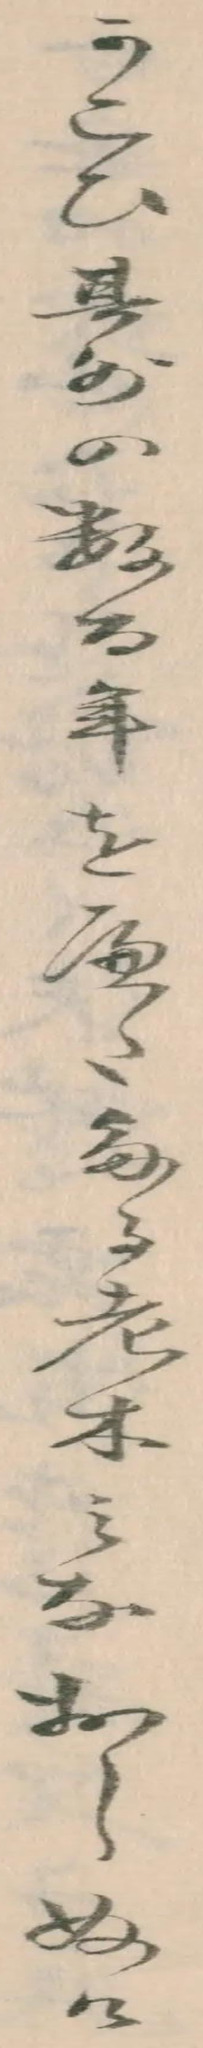かこひ其外の数る年をへたたる老木みなおしぬけ
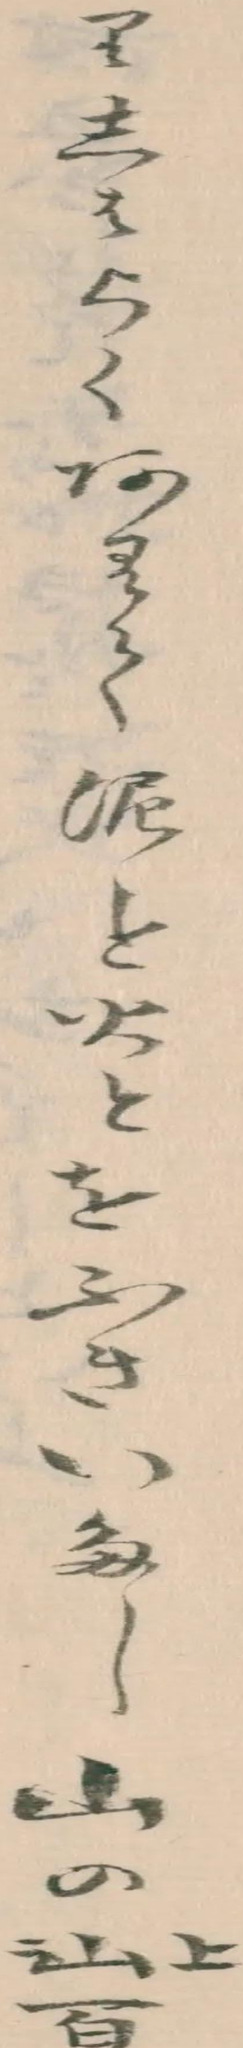りしはらくありて泥と火とをふきいたし山の上百
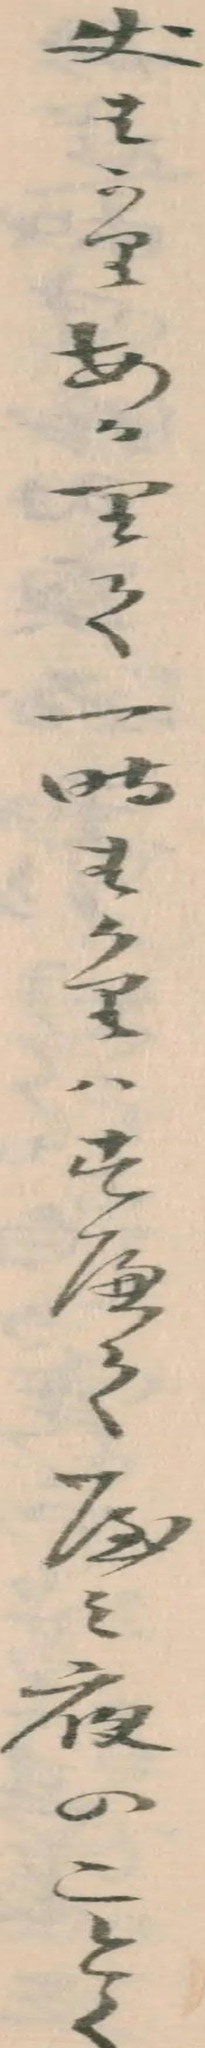丈はかりあかりて一時はかりはすへてやみ夜のことく
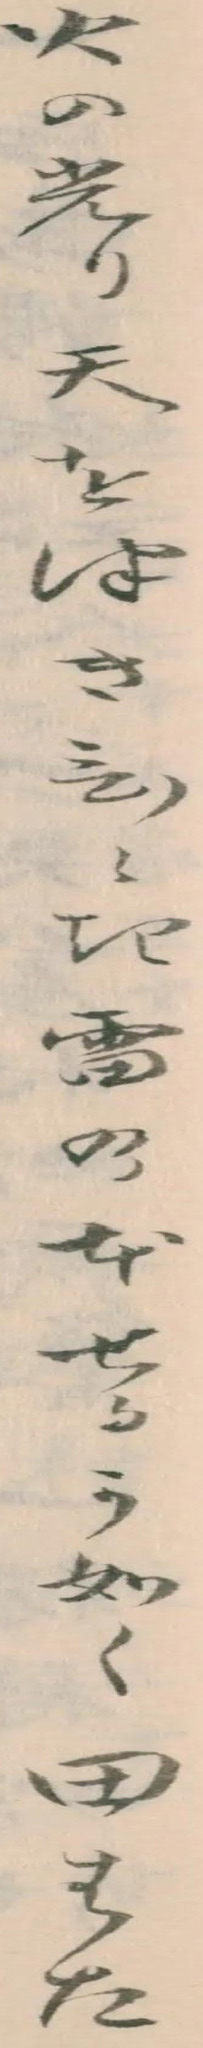火の光り天をつきひゝき雷のほせるか如く田はた
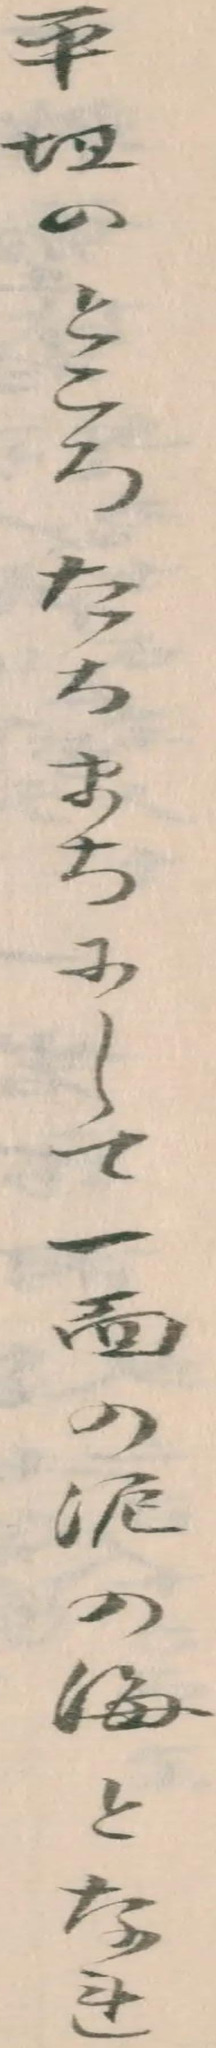平坦のところたちまちにして一面の泥の海となれ
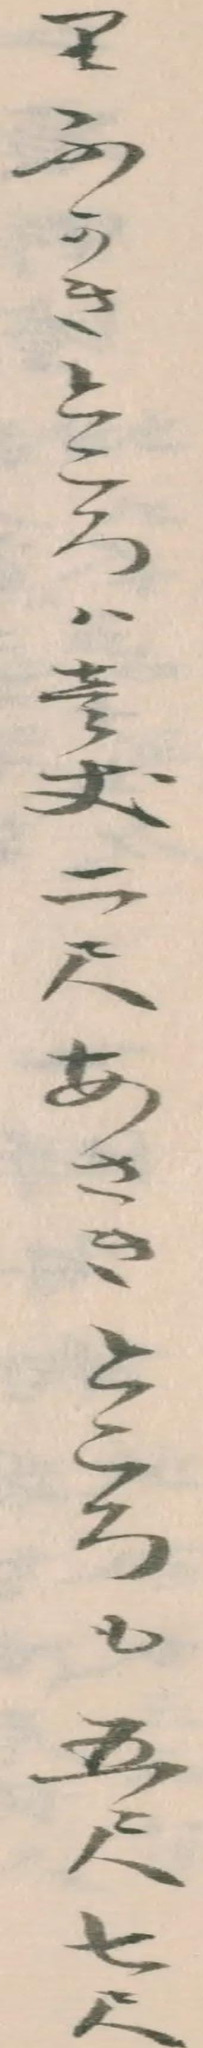りふかきところは壱丈二尺あさきところも五尺七尺
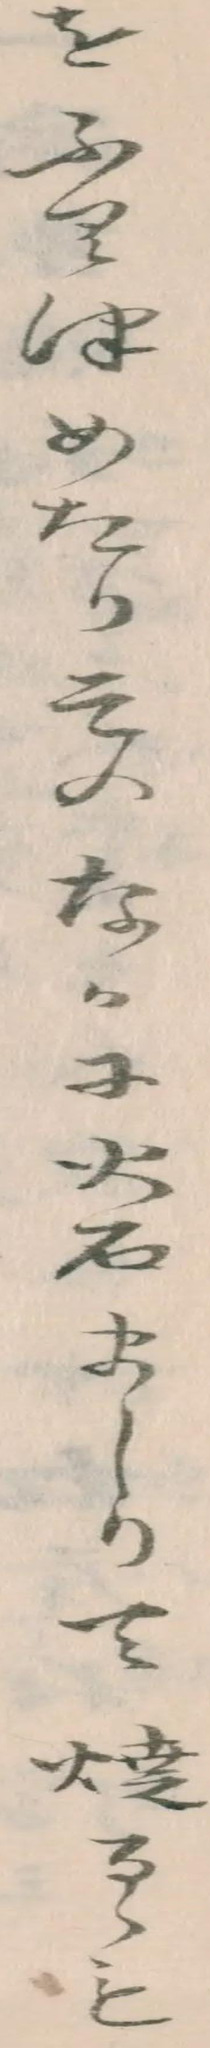をふりつめたりそのなかに火石ましりて焼るゝも
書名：地災撮要. 巻11-12(地震之部)
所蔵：国立国会図書館 National Diet Library, JAPAN
